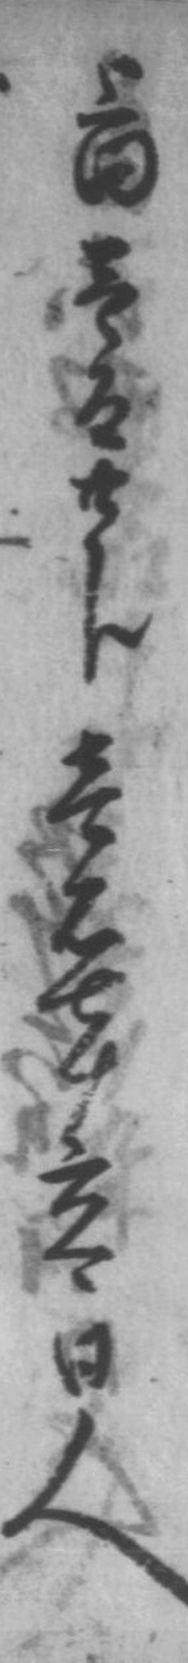上田壱反廿分壱石七斗六合同人
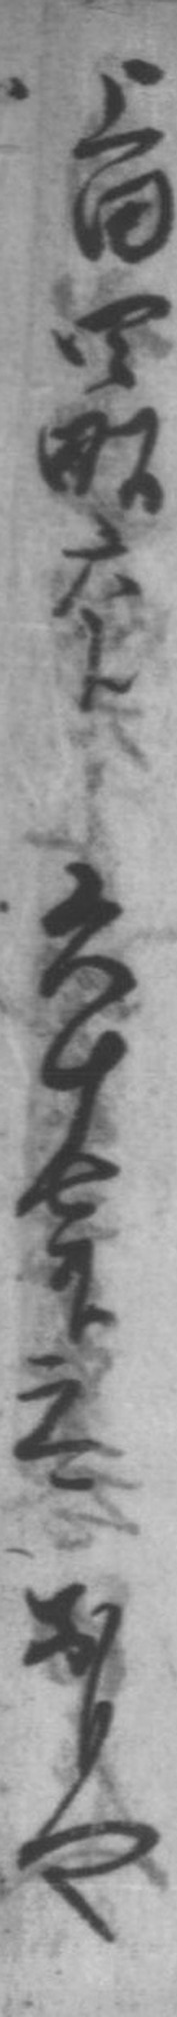上田四畝六分六斗七升二合おりや
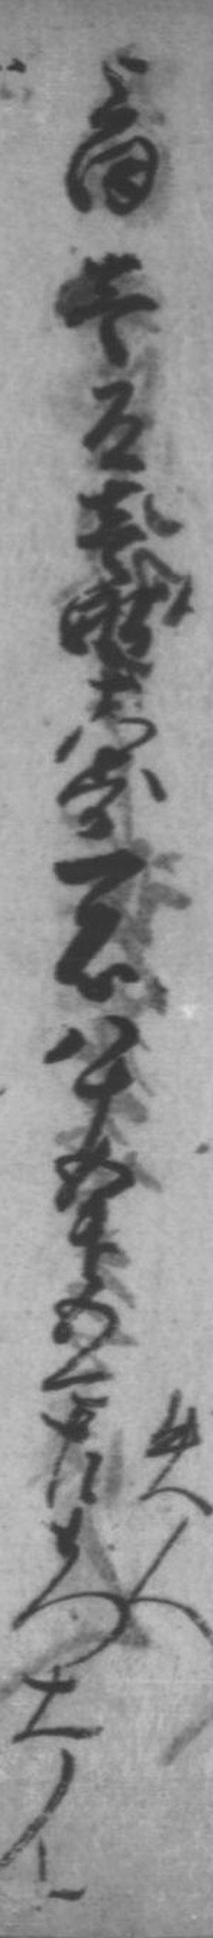上田壱反壱畝十八歩一石八斗五升五合左衛門太郎
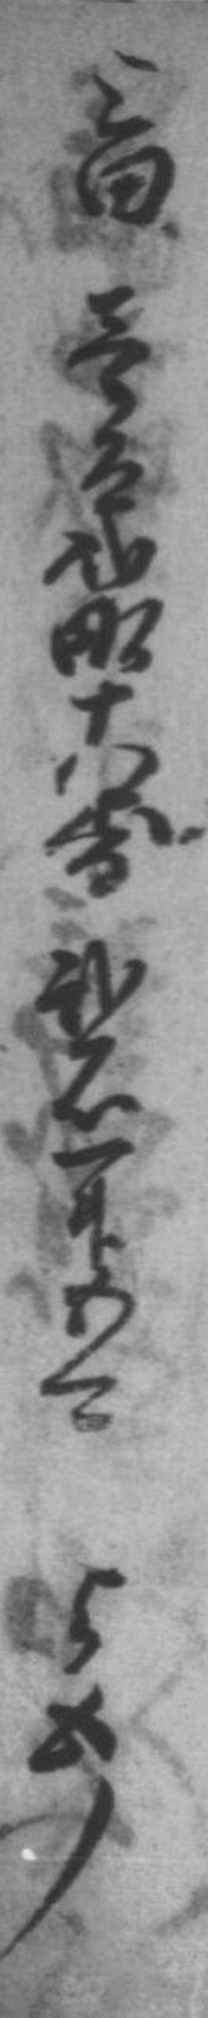上田壱反弐畝十八歩弐石一升五合与五郎

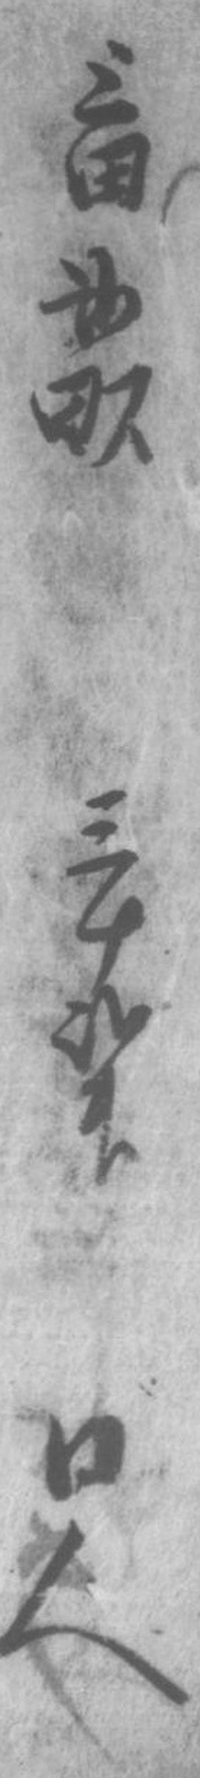上田弐畝三斗弐升同人
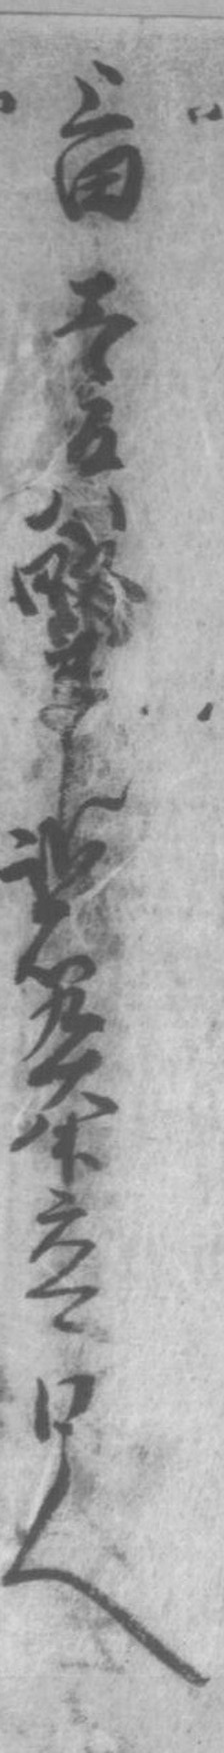上田壱反八畝廿分弐石九斗八升六合同人
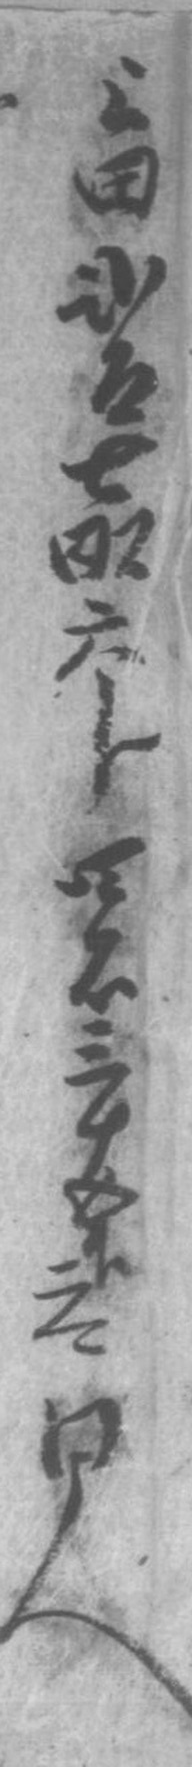上田弐反七畝六分四石三斗五升二合同人
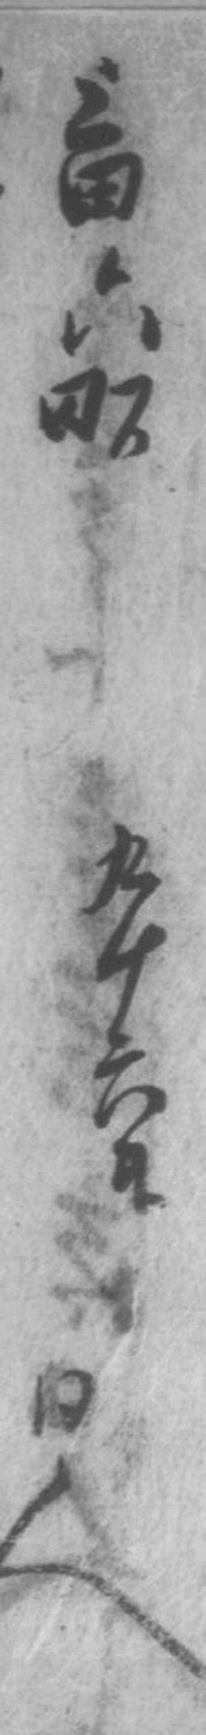上田六畝九斗六升同人
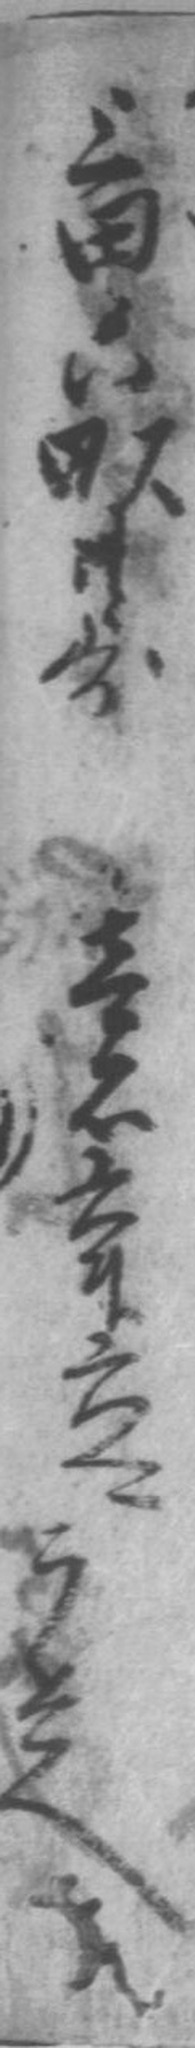上田六畝廿歩壱石六升六合二郎兵衛
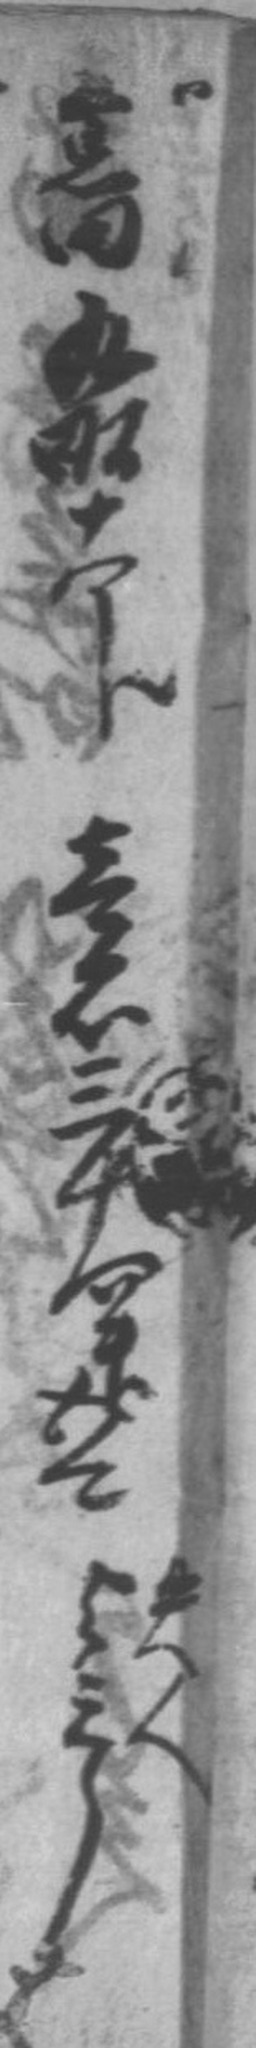荒田九畝十八分壱石三斗四升五合与三郎
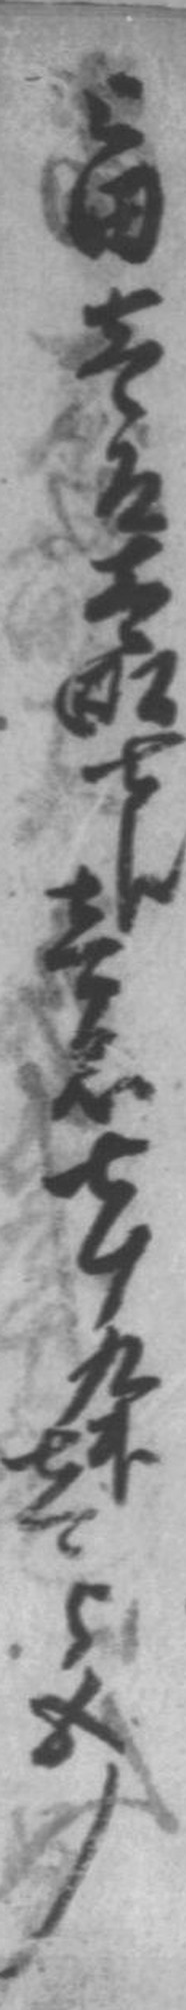上田壱反壱畝七分壱石七斗九升七合与五郎
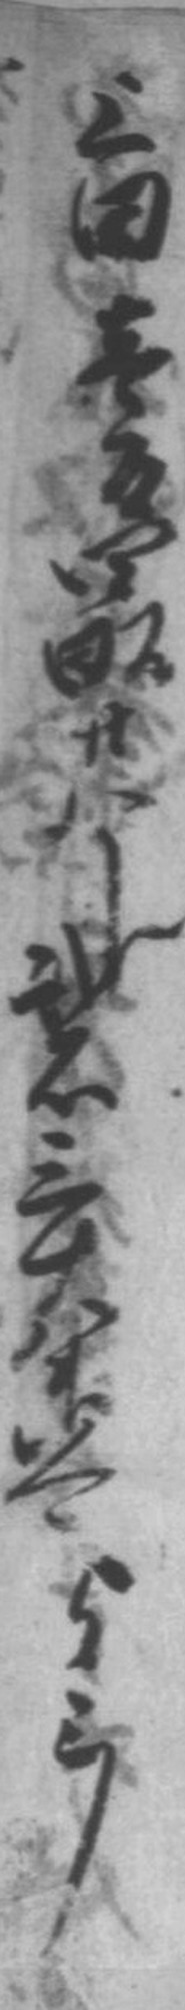上田壱反四畝廿八分弐石三斗八升八合与三郎

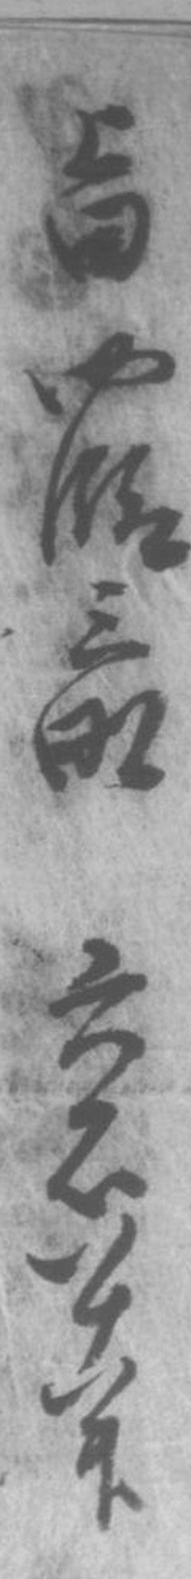上田四段三畝六石八斗八升同人
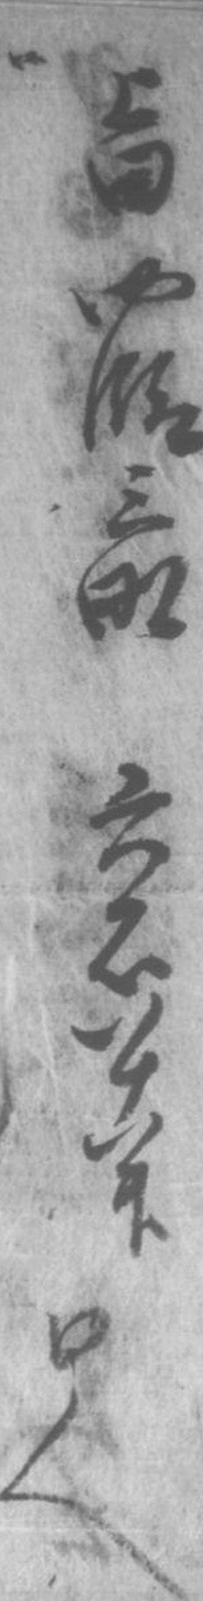上田四段三畝六石八斗八升同人
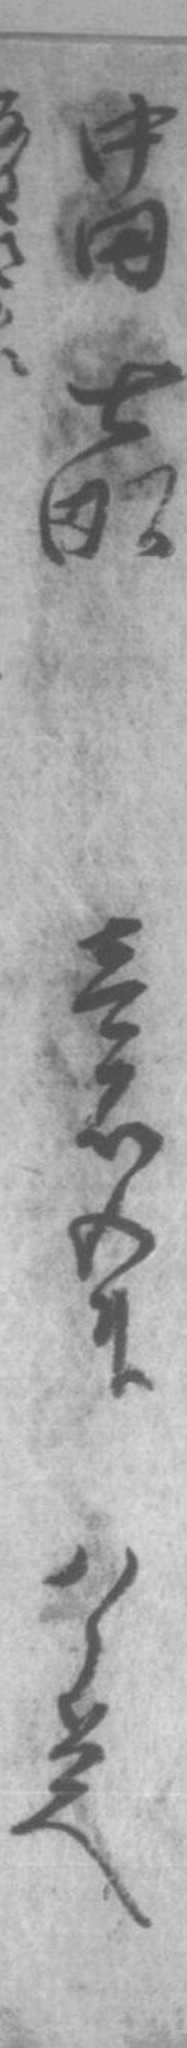中田七畝壱石五升八郎兵衛
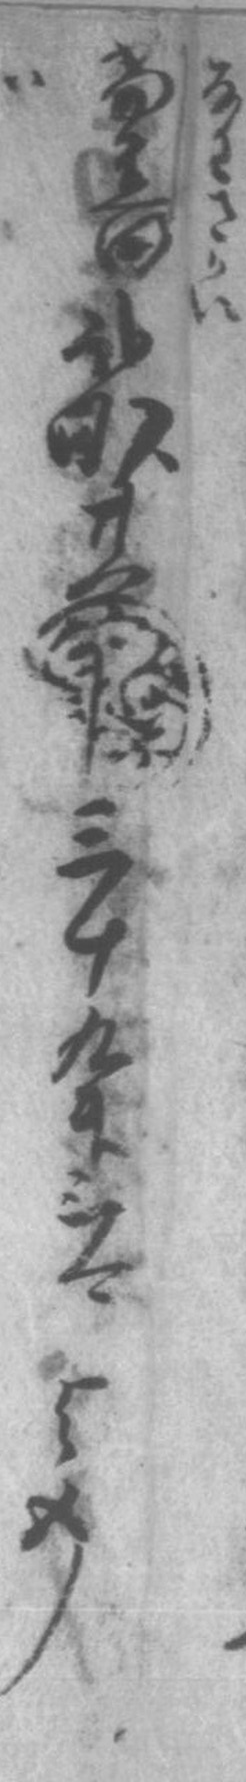当荒田弐畝廿四分㊞三斗九升三合与五郎
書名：越州大野郡ノ内不動堂村御検地帳
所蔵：福井県文書館 Fukui Prefectural Archives
